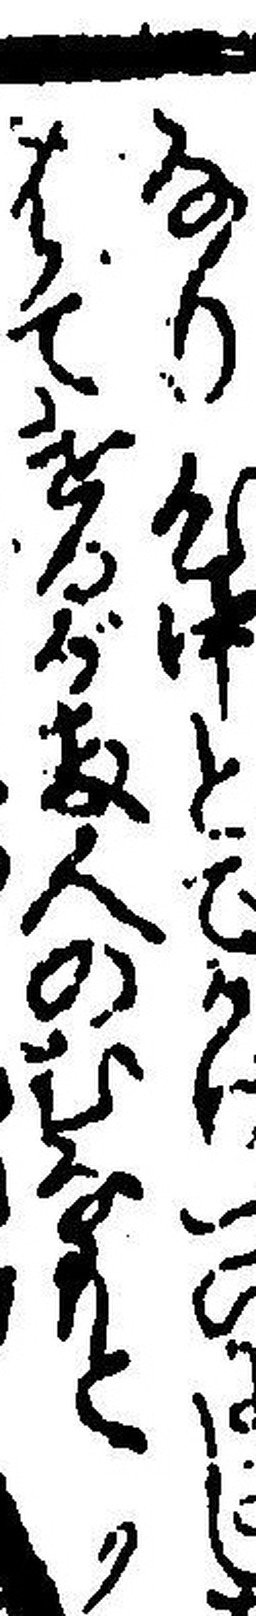はてけるが両人のむなもと
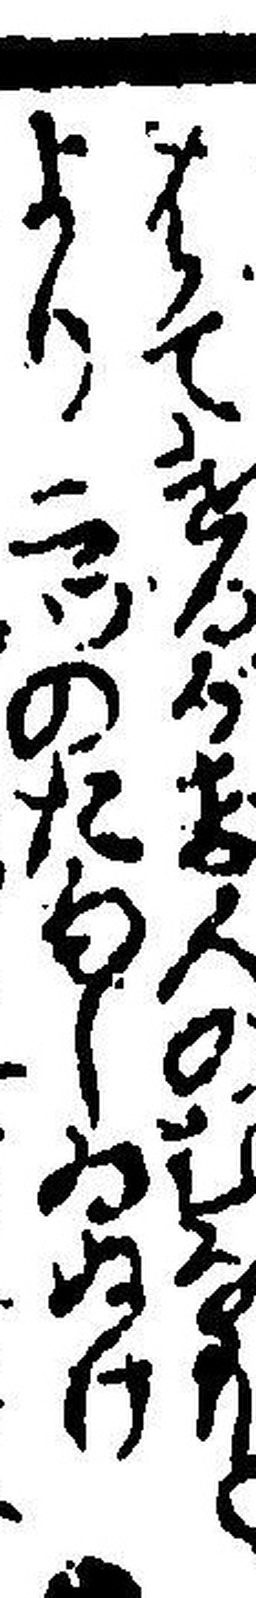より二つのたましゐぬけ
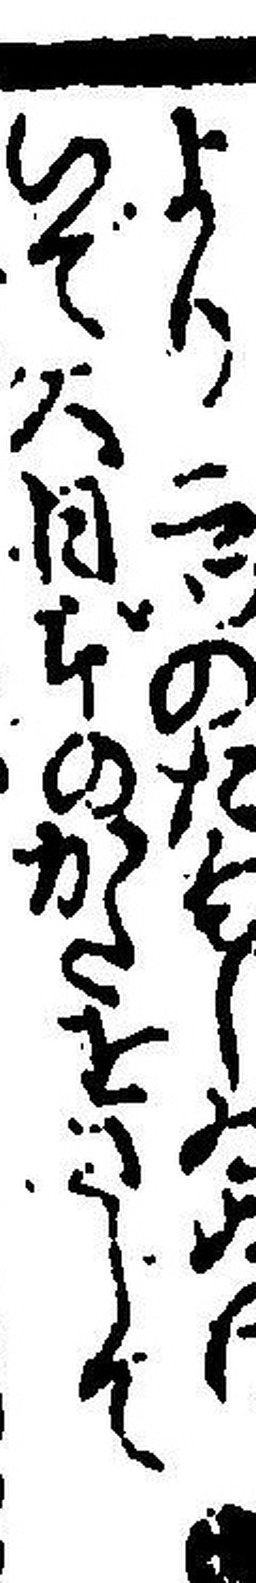いで大日本のかたをさして
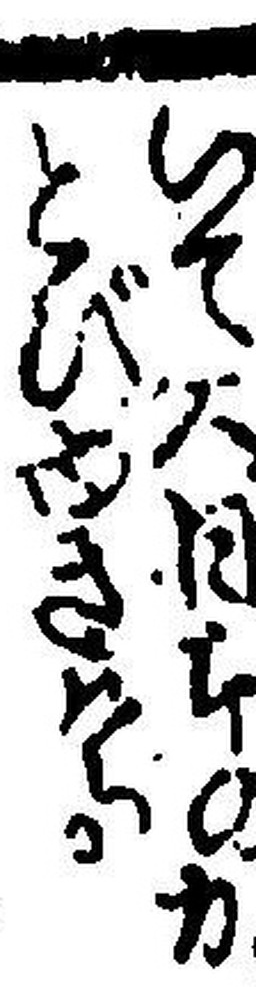とびゆきける
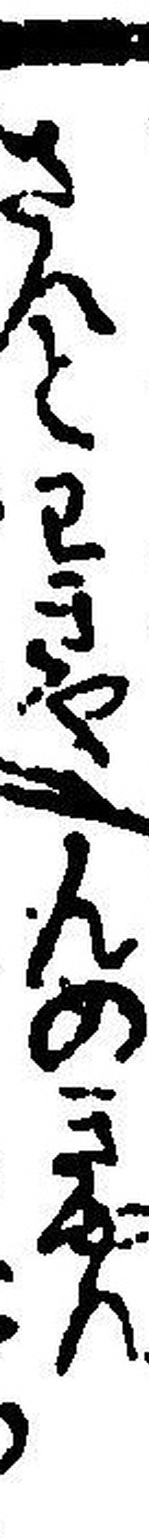さんとわきゃんのきゃん
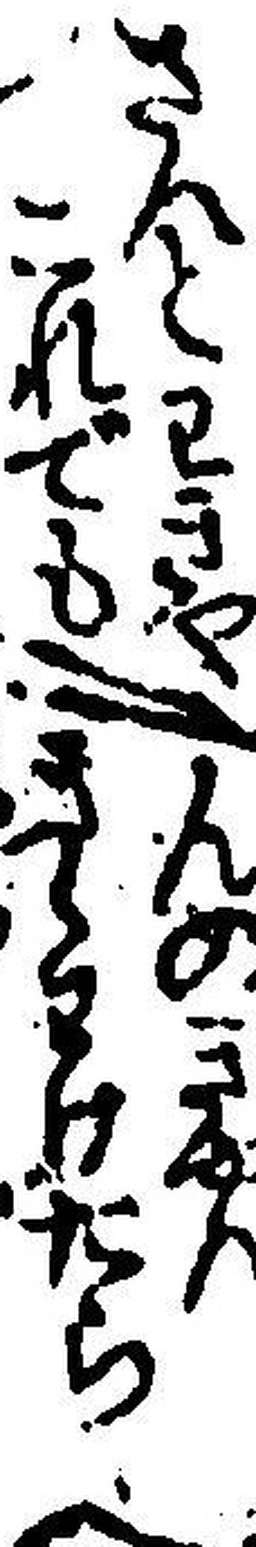これでもきゝわけたら
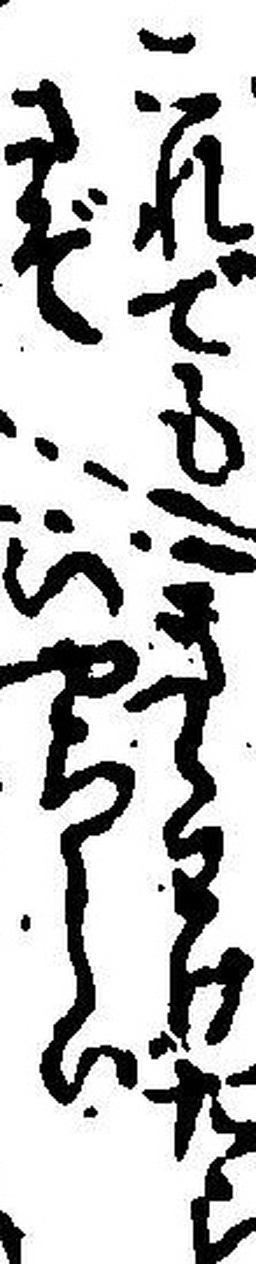さぞいやらしい
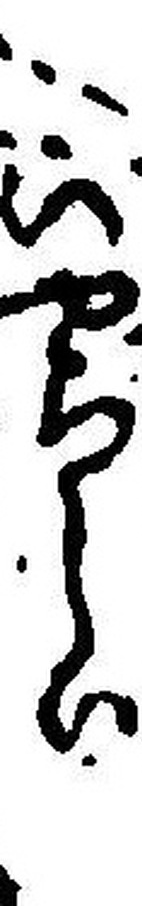さぞいやらしい
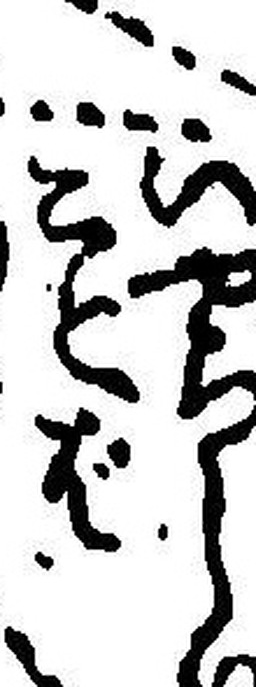ことば

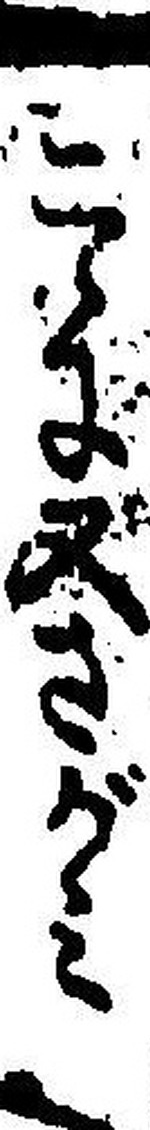こゝに又さがみ
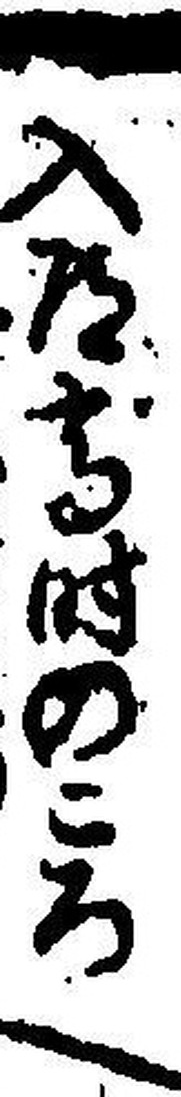入道高時のころ
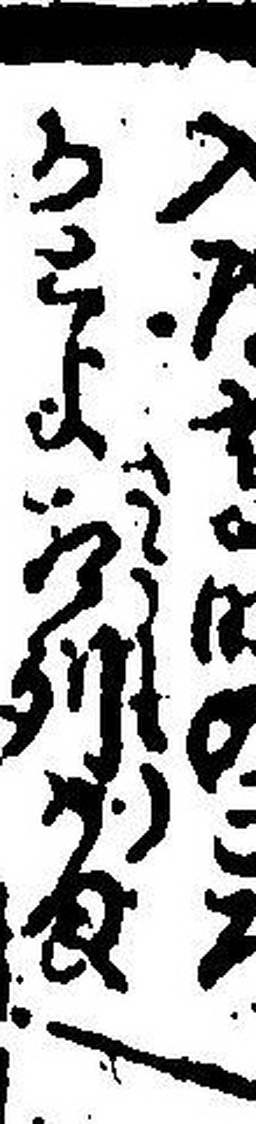かとよ相州かま
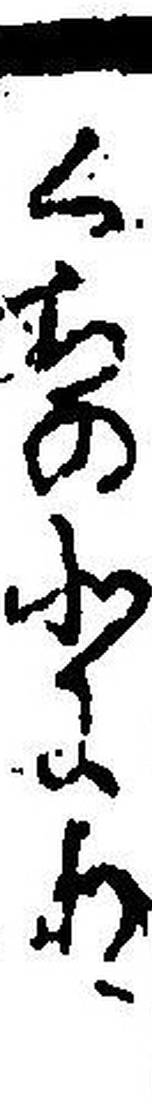くらの北にあ
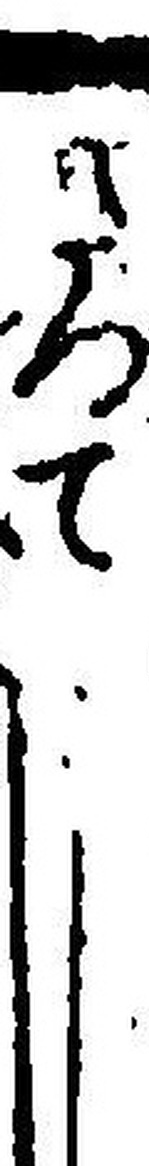たつて
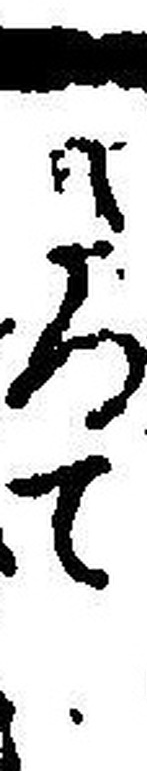たつて
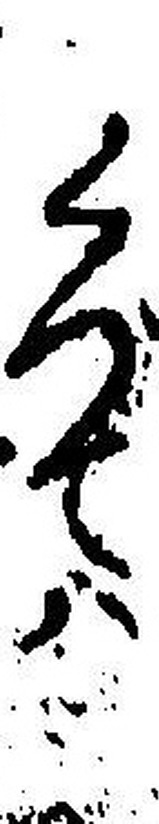くつては
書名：花芳野犬斑 / 山東京伝作
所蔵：東京大学総合図書館 General Library in the University of Tokyo, JAPAN
